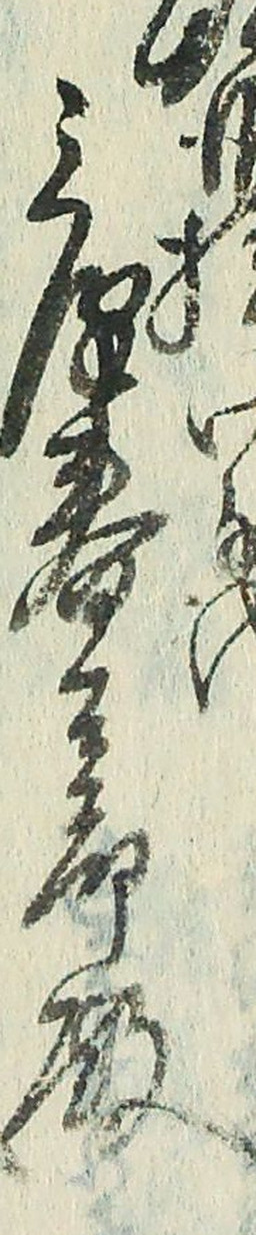三沢春太郎殿
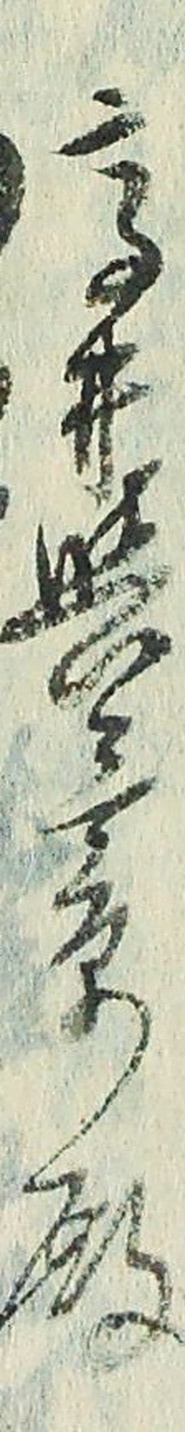高井与三兵衛殿
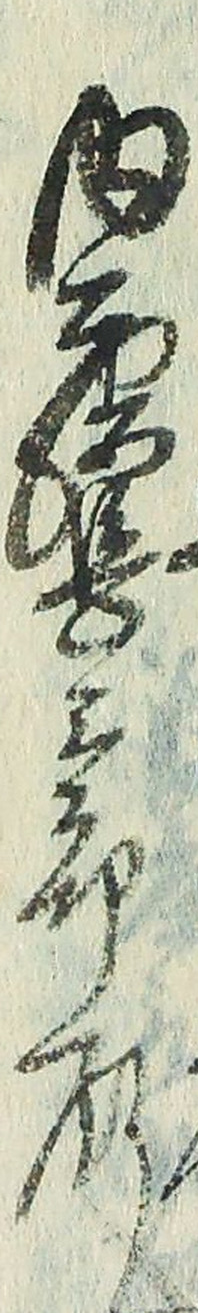内藤長三郎殿
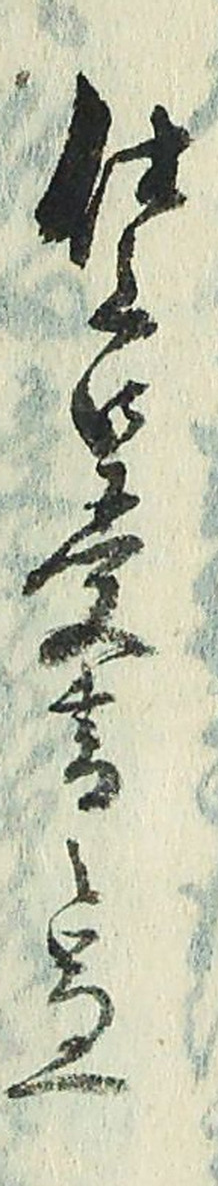仕上御受書之覚
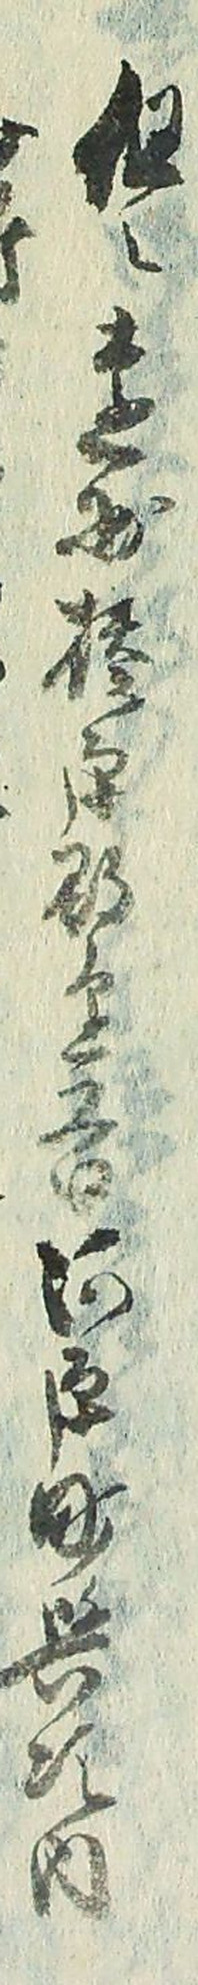但し遠州榛原郡金谷河原町与次内
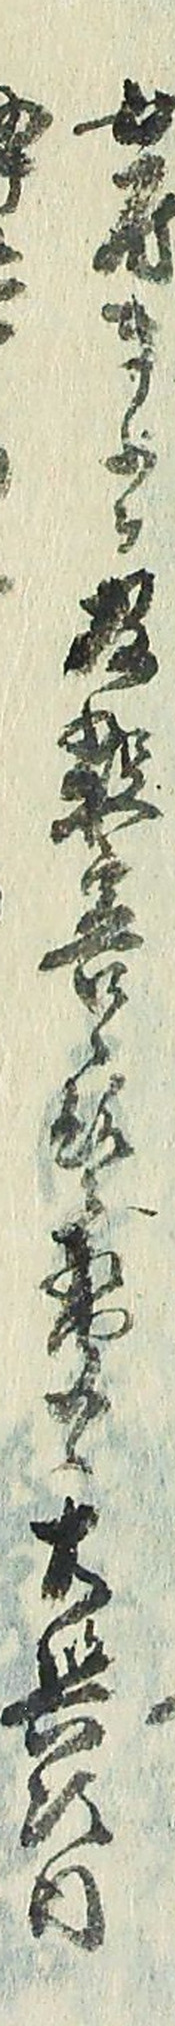女房きよを及殺害候趣に相聞候右与次内
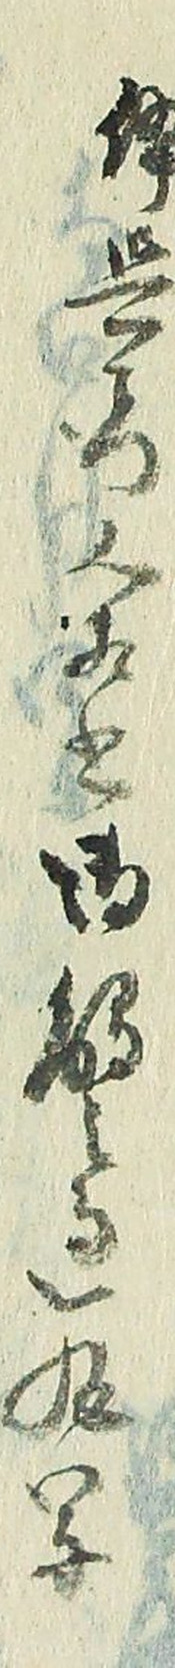忰与右衛門人相書御触之通丸写
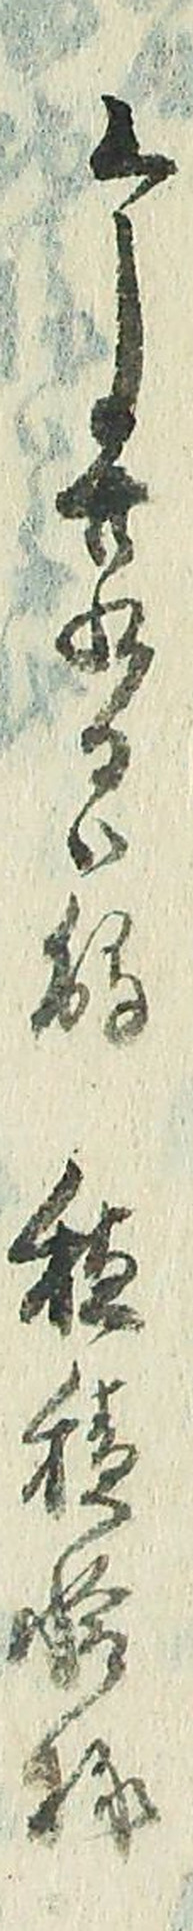三月廿九日御触穂積恰様
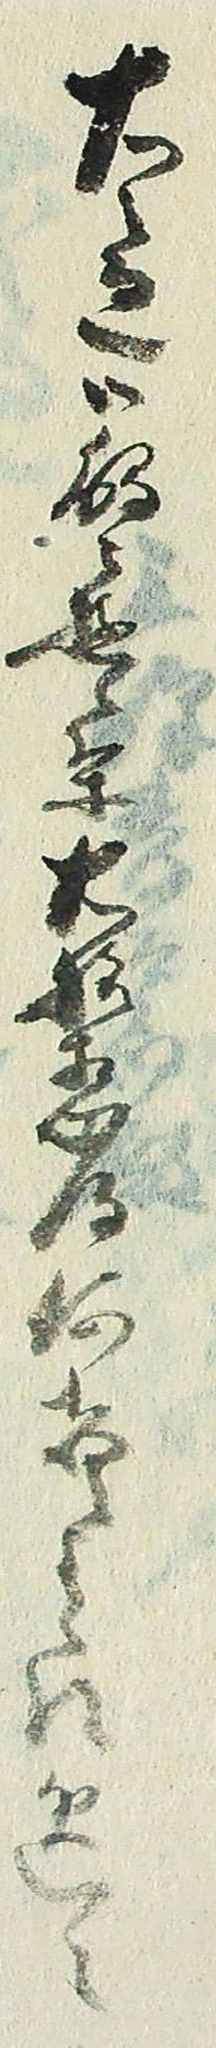右之通御触被遊候条右様相心得何者によらす逸々
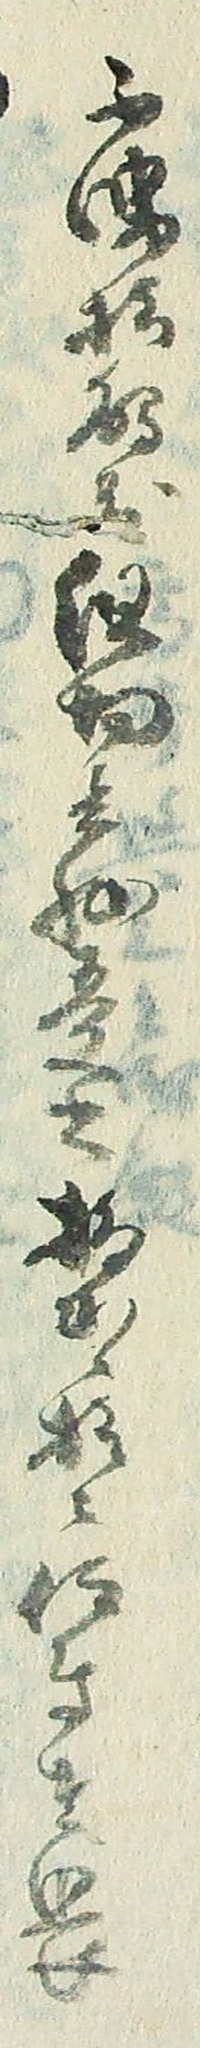不洩様触知組切壱紙受書指出候様被仰付奉畏
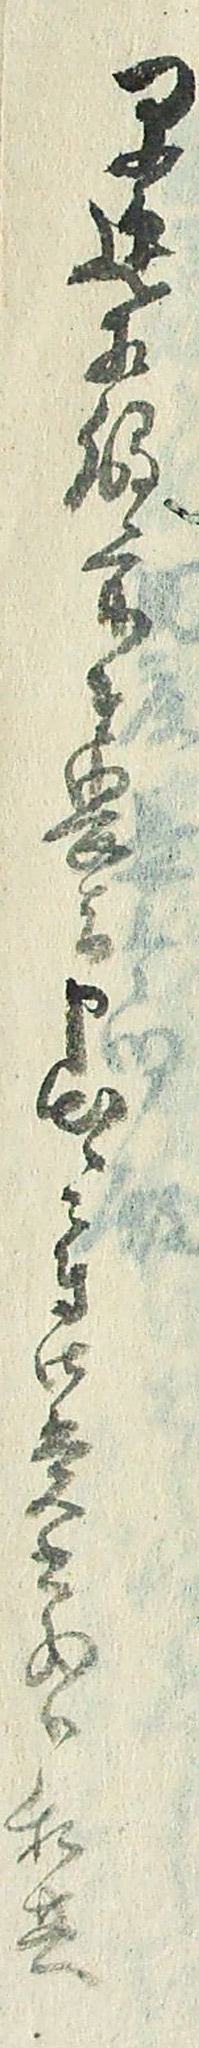早速相触候所奉畏旨申出候に付御受書義は私共

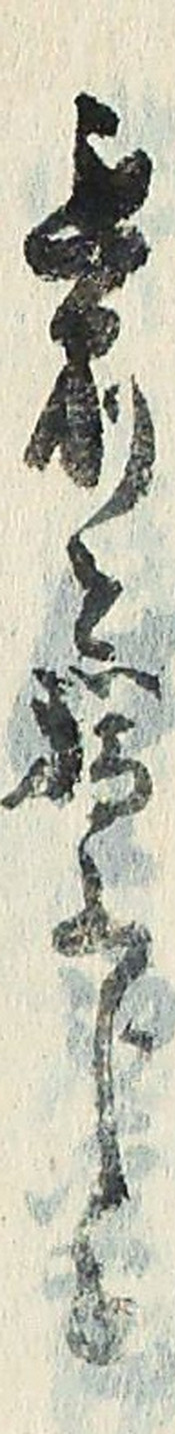連判を以指上申候以上
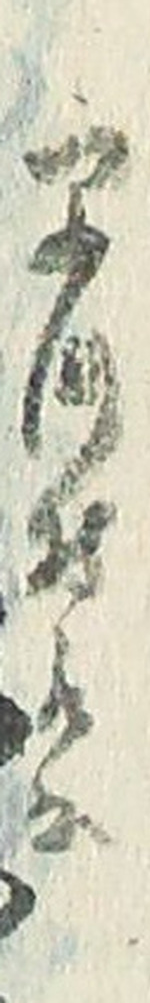早淵村庄屋
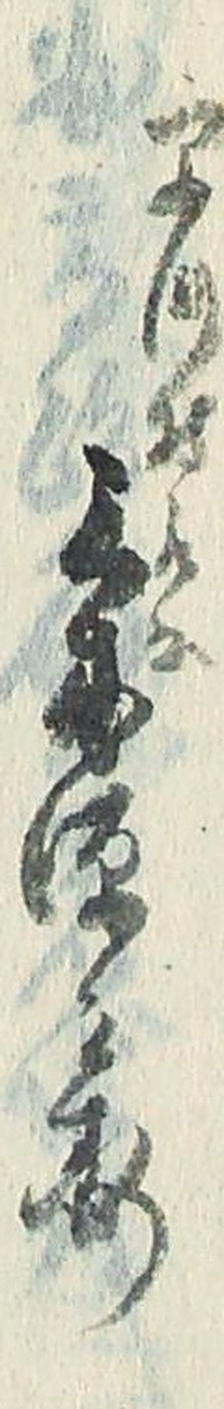三木源兵衛
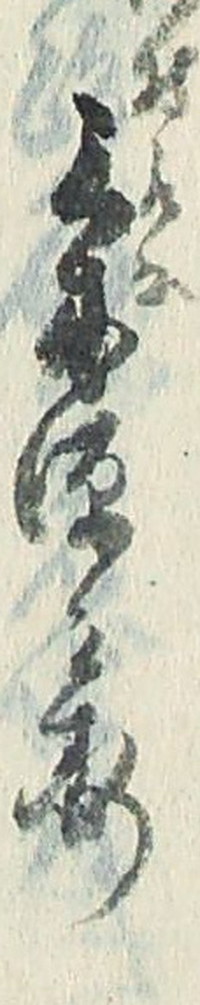三木源兵衛
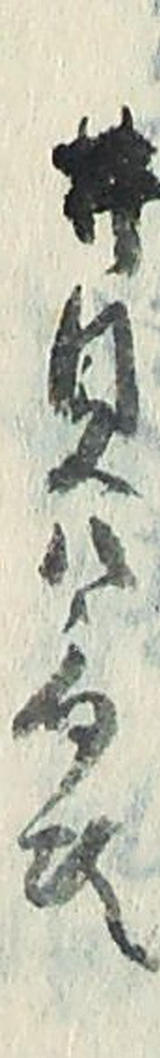井貝八郎次
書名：諸御用御□受書控
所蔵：鳴門教育大学 Naruto University of Education
